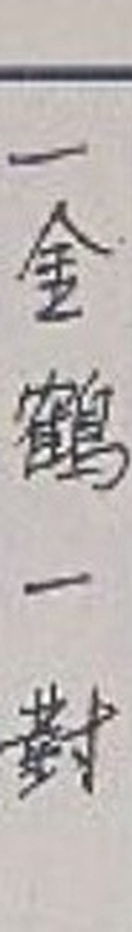一金鶴一対
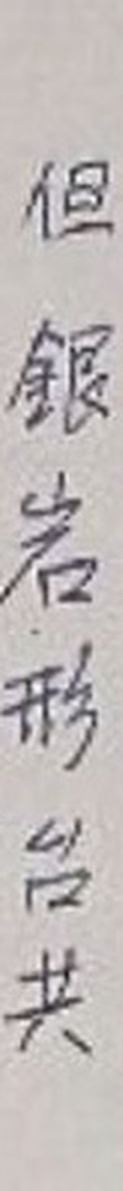但銀岩形台共
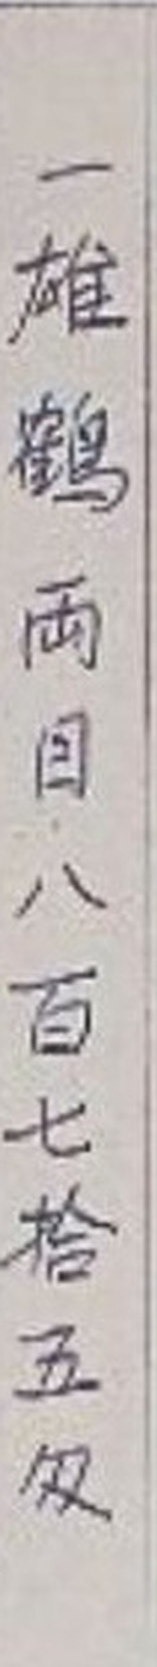一雄鶴両目八百七拾五匁
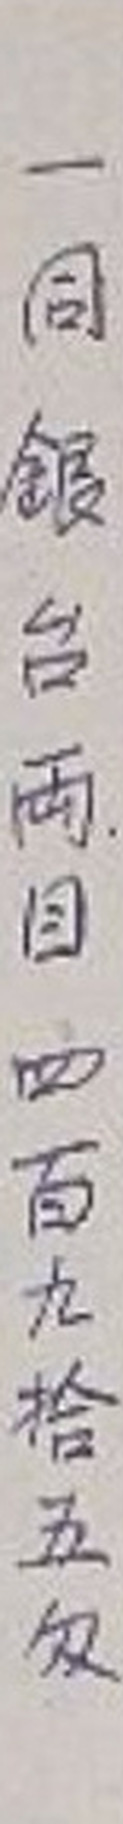一同銀台両目四百九拾五匁
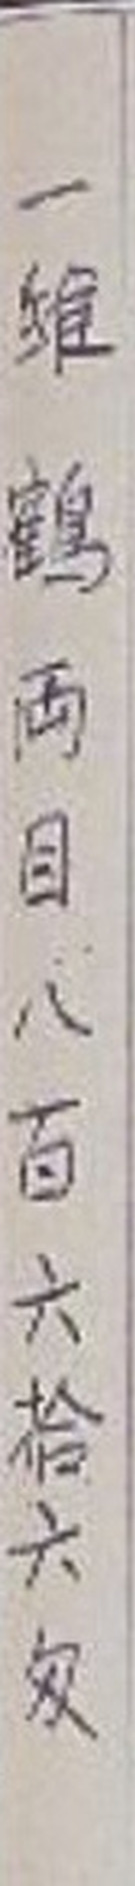一雌鶴両目八百六拾六匁
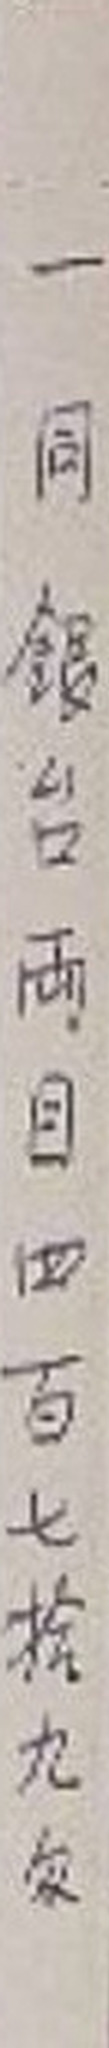一同銀台両目四百七拾九匁
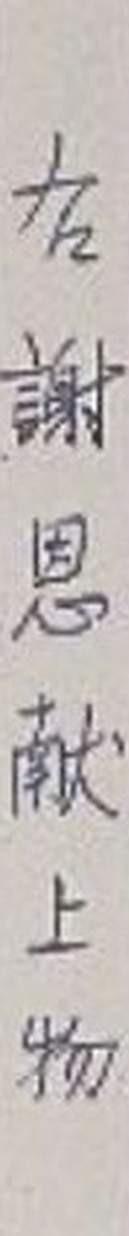右謝恩献上物

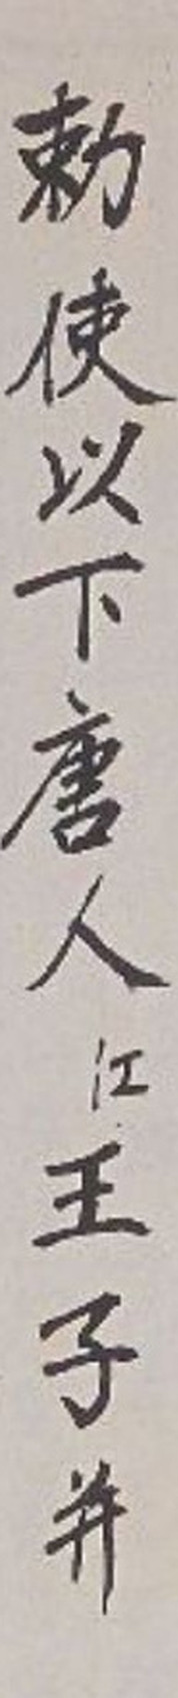勅使以下唐人え王子并
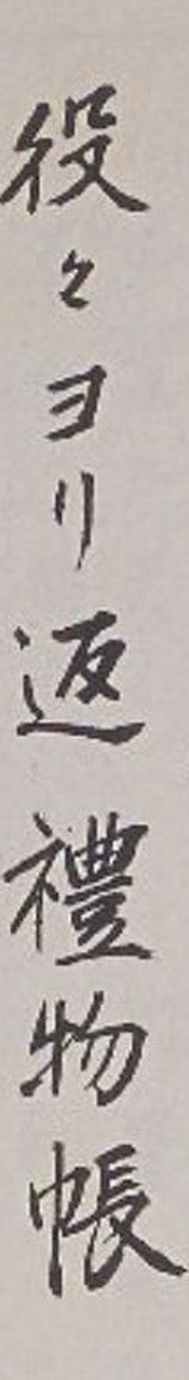役々より返礼物帳

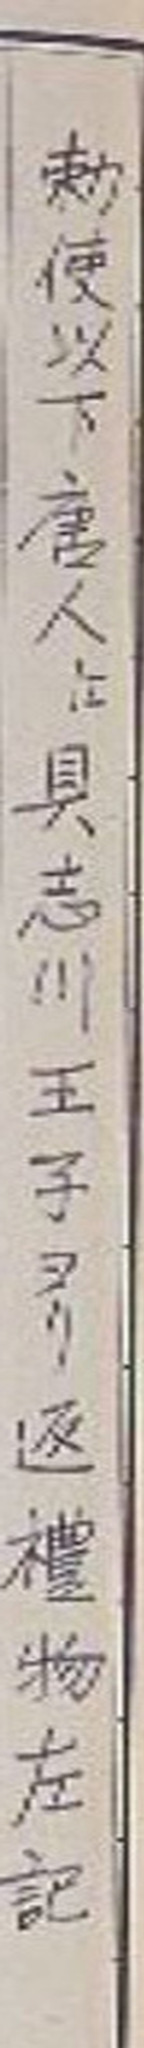勅使以下唐人え具志川王子より返礼物左記
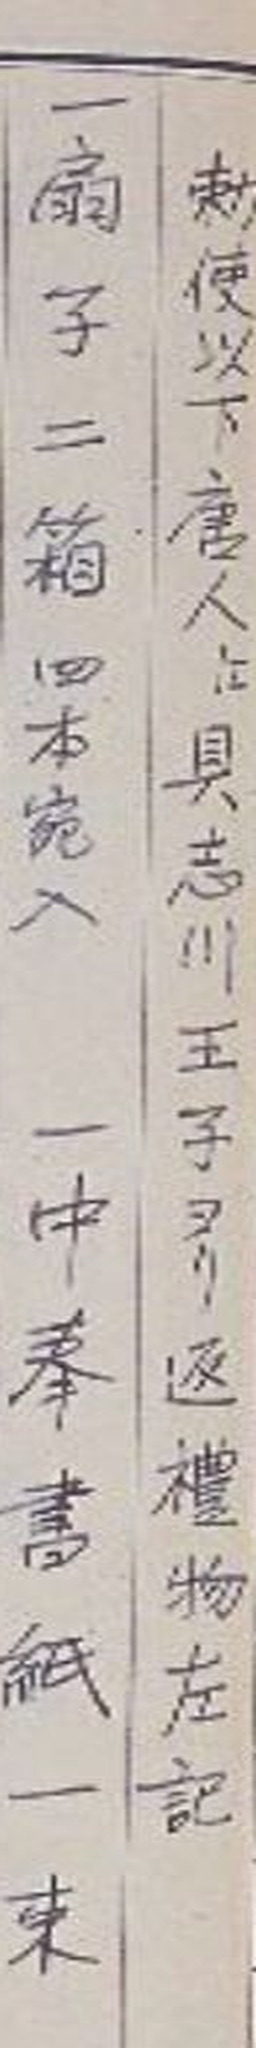一扇子二箱四本宛入一中奉書紙一束
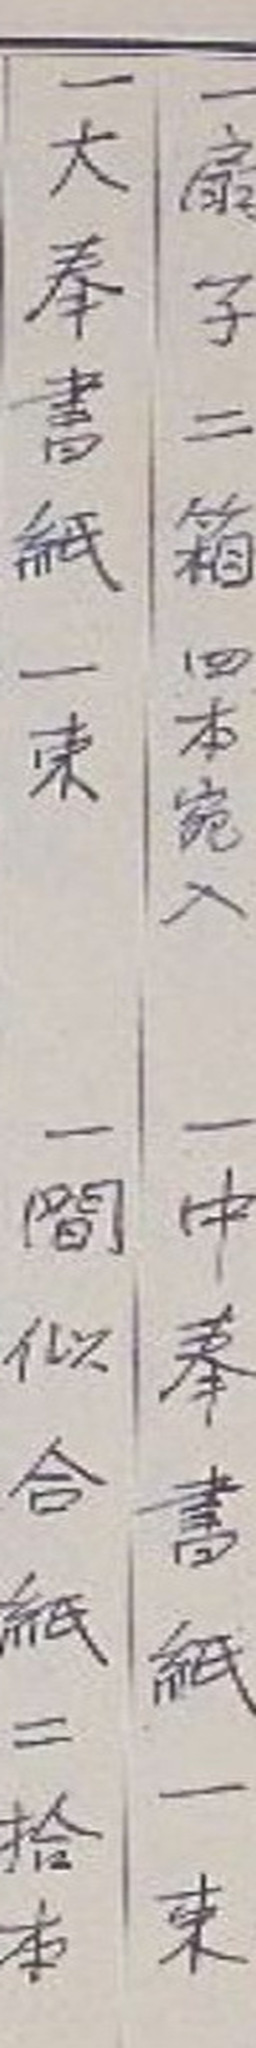一大奉書紙一束一間似合紙二拾本
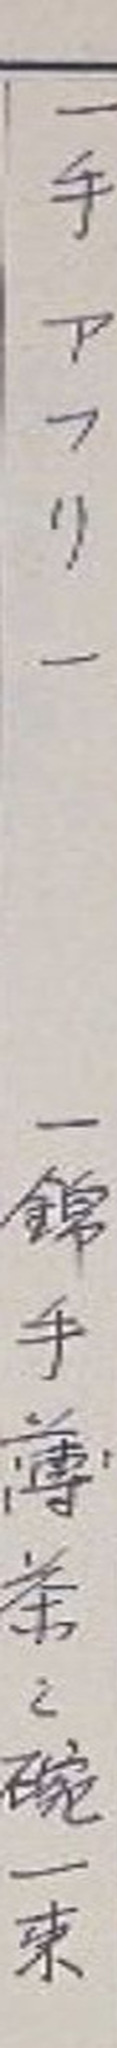一手あふり一一錦手薄茶々碗一束
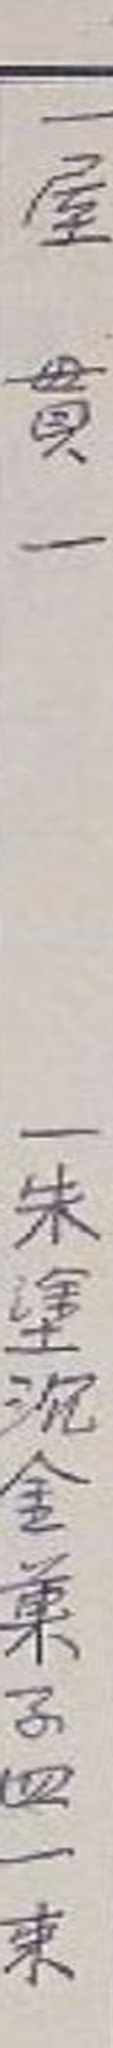一屋貫一一朱塗沈金菓子皿一束
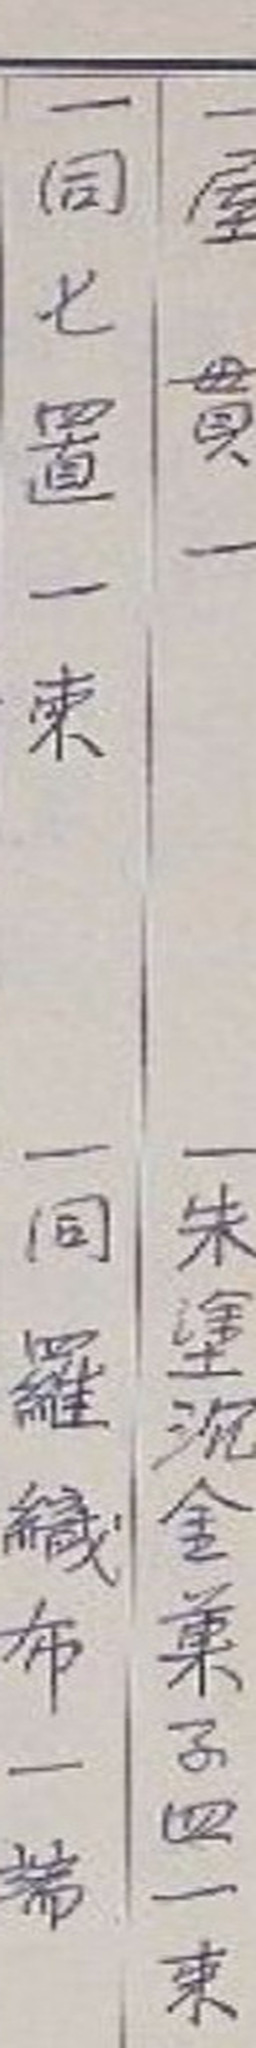一同匕置一束一同羅織布一端
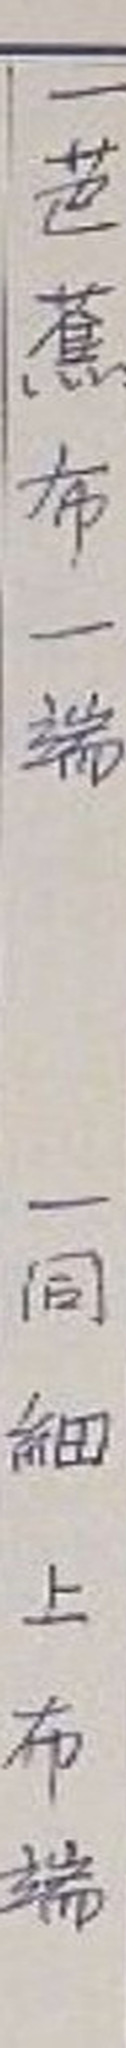一芭蕉布一端一同細上布端
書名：支那冊封使来琉諸記 下巻
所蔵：University of the Ryukyus Library
